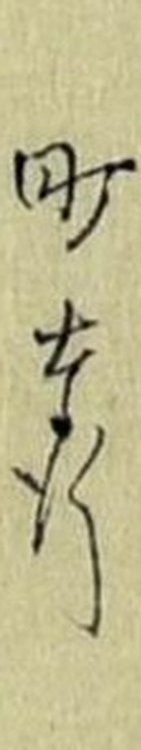町奉行
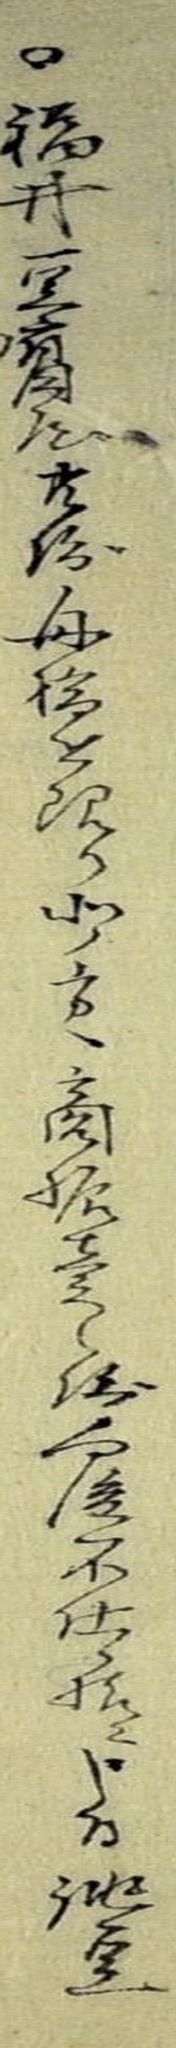〇福井豆腐屋共儀舟橋を限り北之方へ商振売之儀向後不仕候様ニ申付誂豆
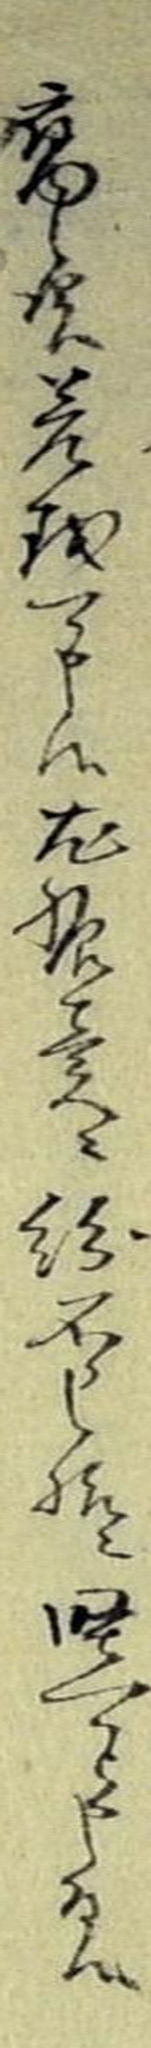腐之儀ハ差越可申候尤振売ニ紛不申様ニ堅可被申付候
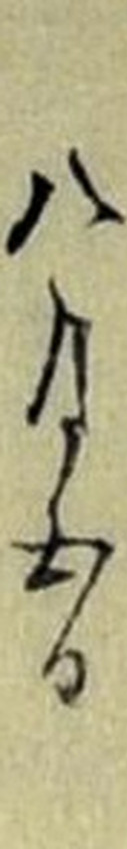八月五日
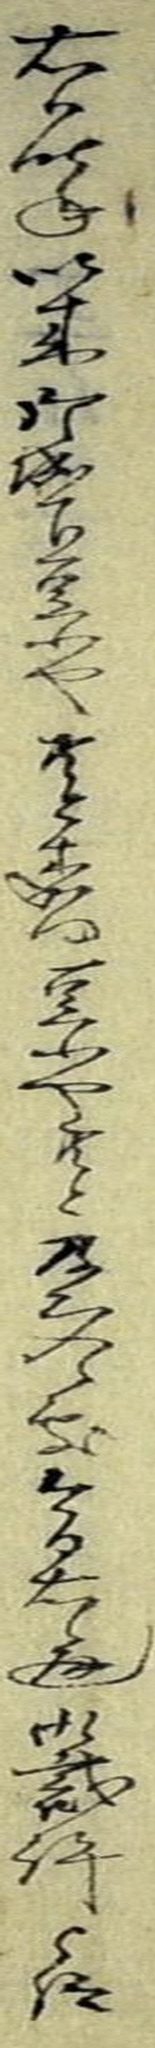右ハ昨年以来御城下豆ふや共と森田豆ふや共と及出入候処今日右之通御裁許被仰
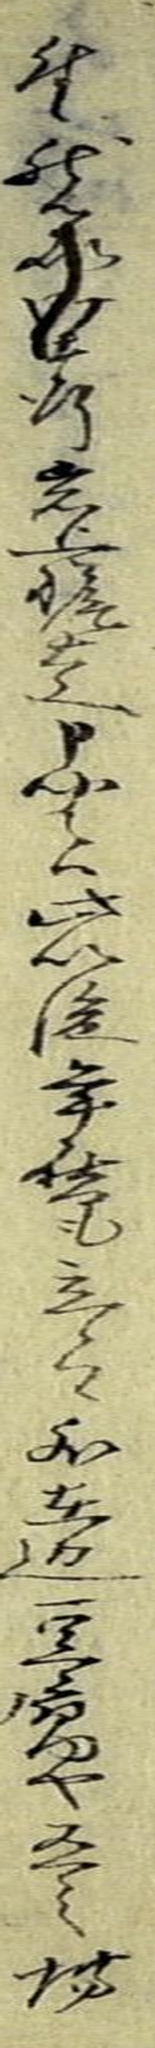付候然ル故町奉行岩上梶大夫申聞候ハ此以後年も立候ハヽ外在辺豆腐や有之場
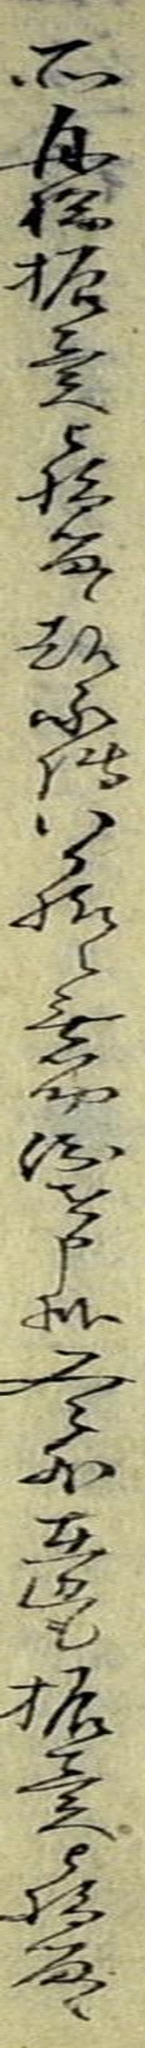所舟橋振売被指留候趣承伝いか様之無筋儀を申掛又々外在辺も振売被指留候
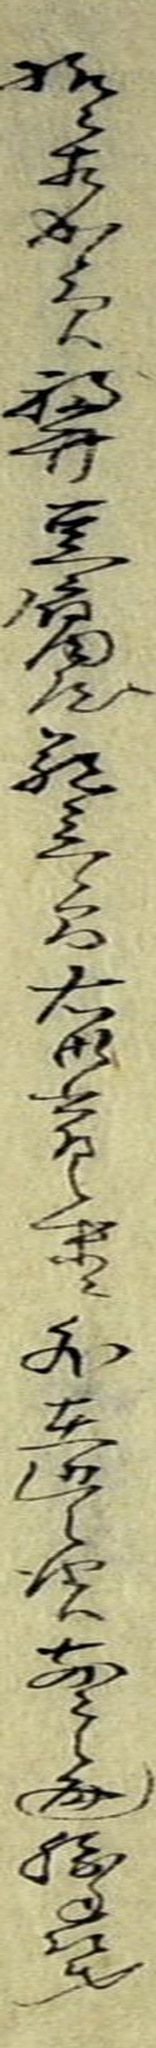様ニ相成候而ハ福井豆腐屋難立候間右御書付之末ニ外在辺之儀ハ前々之通勝手次第
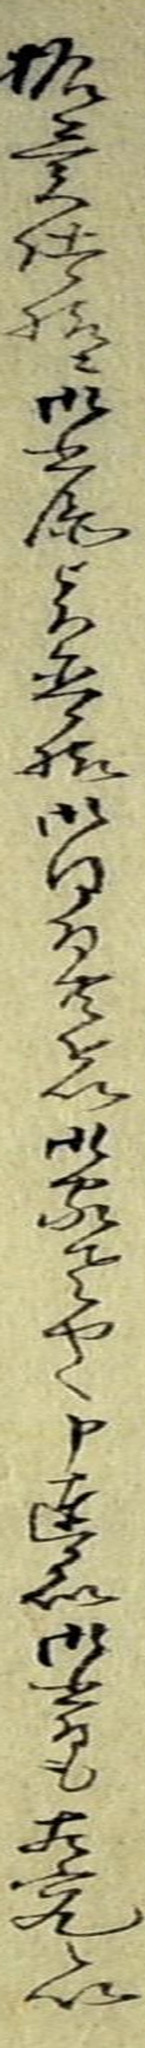振売仕候様ニ御書添被下置候様御目付共を以御家老中へ申達候処御書付も相究候以
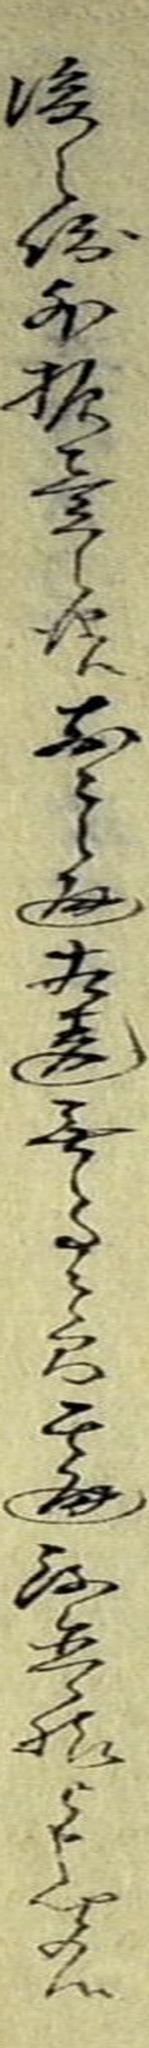後之儀外振売之儀ハ前々之通相違無之事ニ候間其通致置候様被申聞候
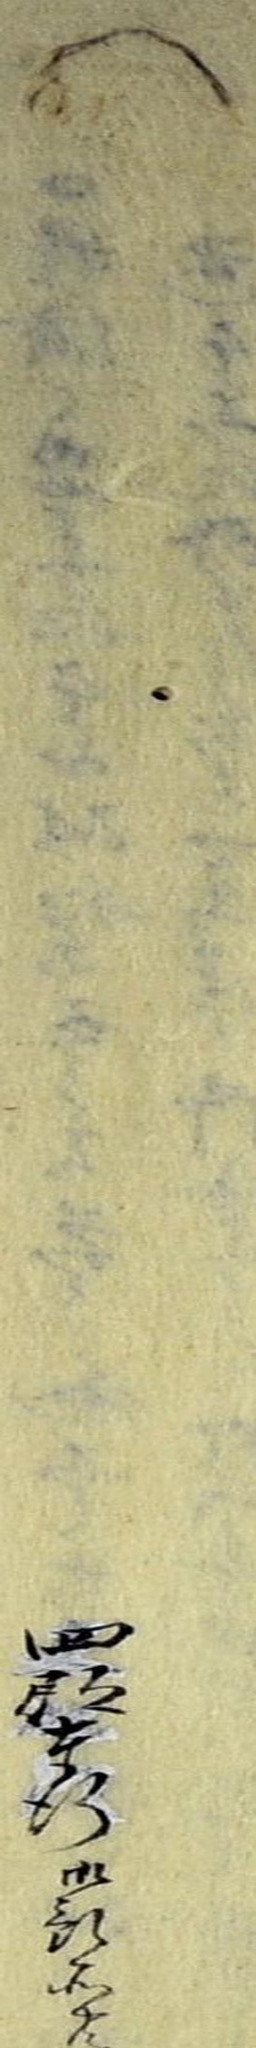四郡奉行御預所共
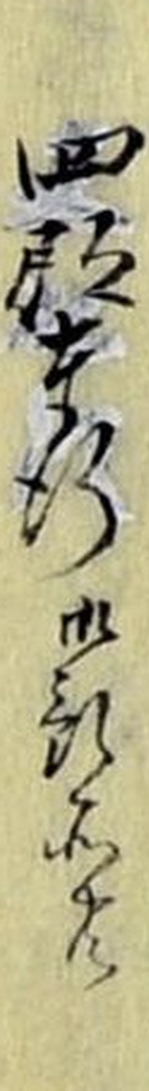四郡奉行御預所共

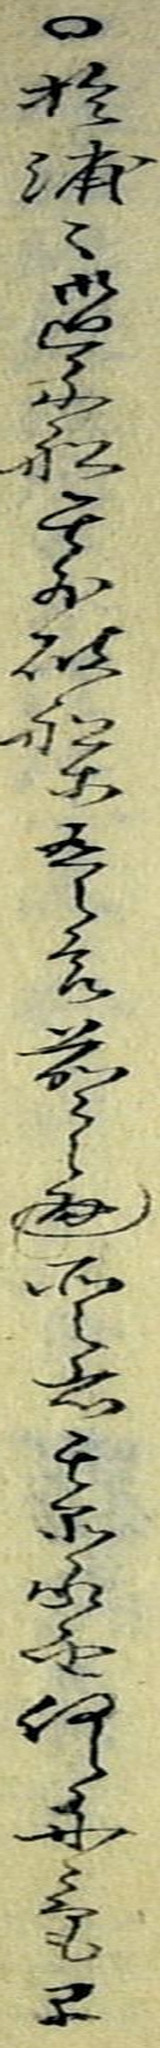〇於浦々御廻米船其外破船等有之節前々之通所之者其品承届何之舟ニ而も早
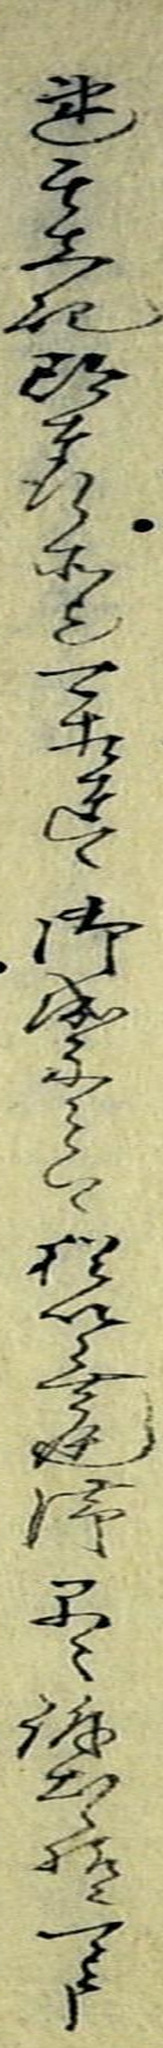速其支配郡奉行所迄可相達候御成舟ニ候ハヽ猶以無遅滞早々訴出候様ニ可被申
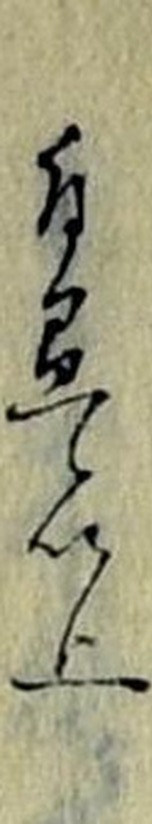付置候以上
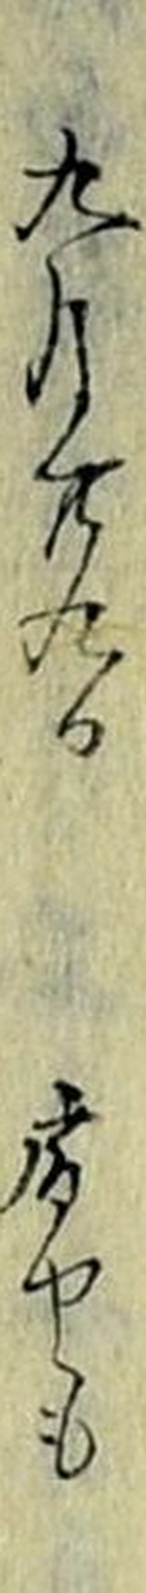九月廿九日府中へも
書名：命令之部 一
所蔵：福井県文書館 Fukui Prefectural Archives
